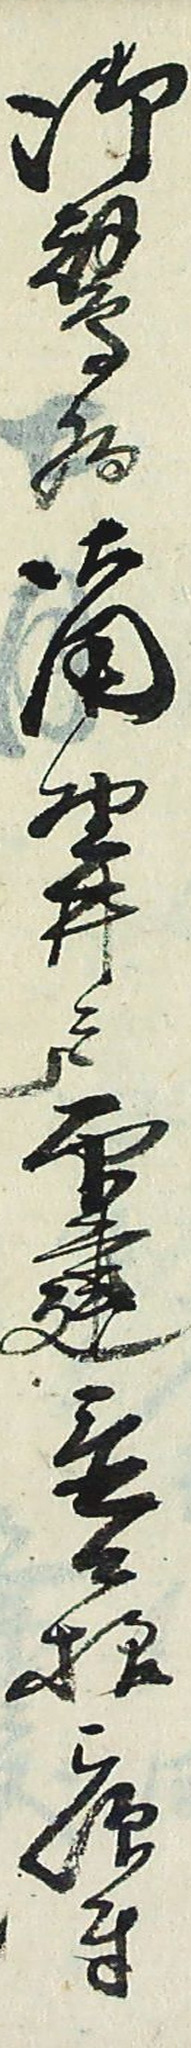御鷹為御用野井之印建置候様被仰付
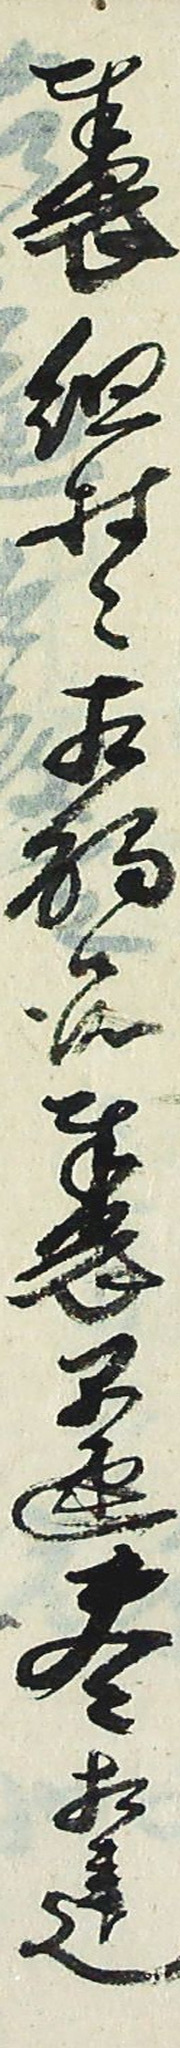奉畏組村々相触候所奉畏早速夫々相建
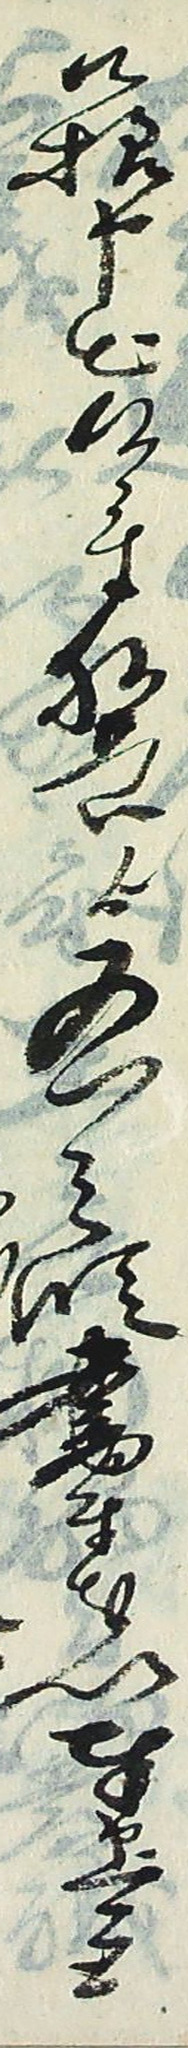候様申出候に付私共ゟ右之段書付を以奉申上候以上
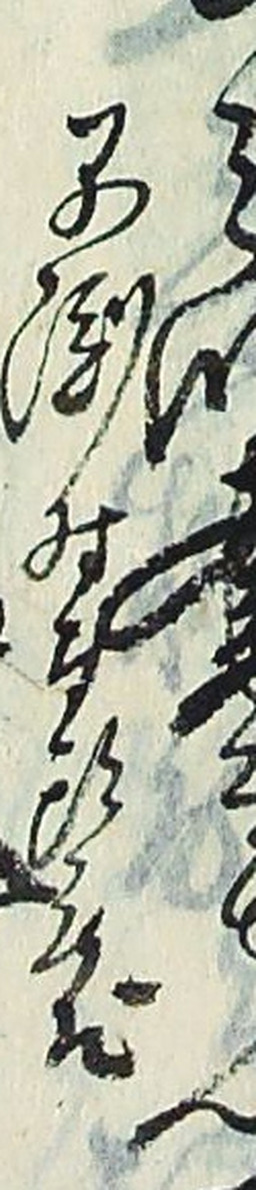早淵村与頭庄屋
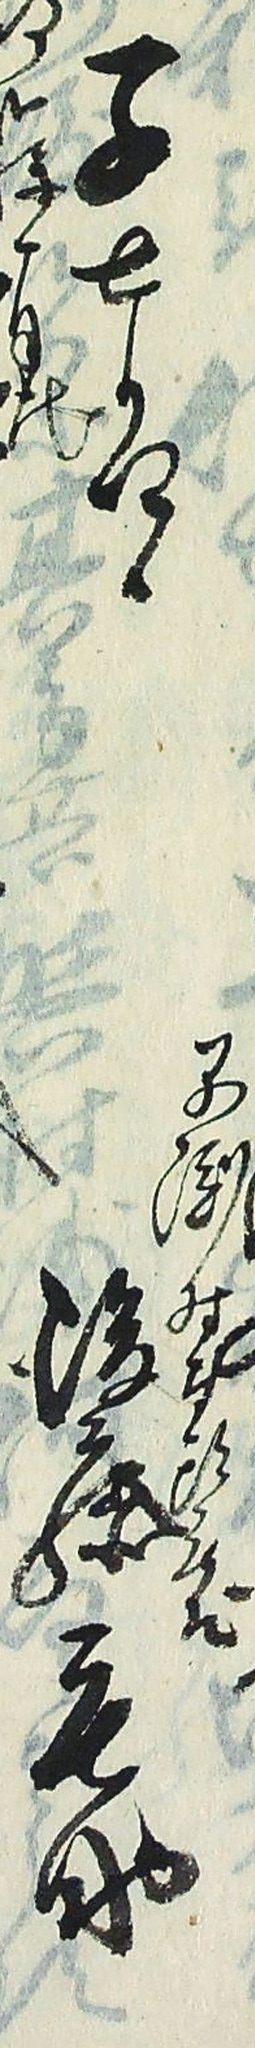子七月四日後藤庄助
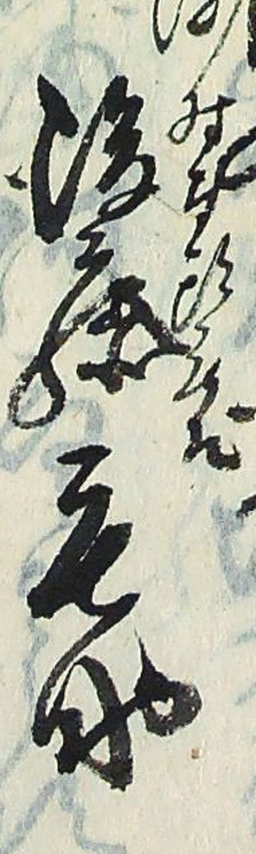後藤庄助
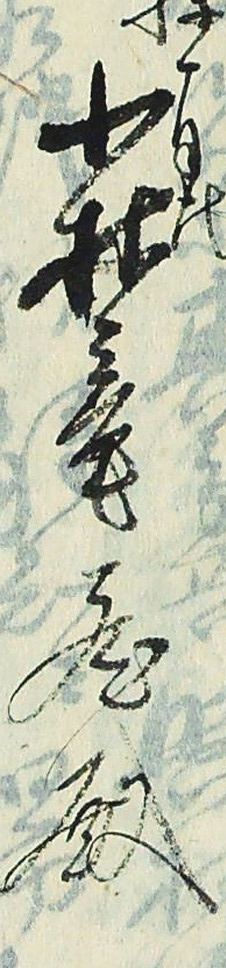小林竜蔵殿
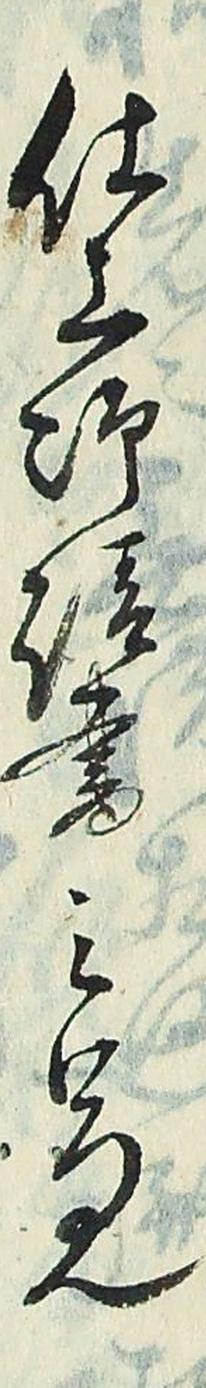仕上御受書之覚
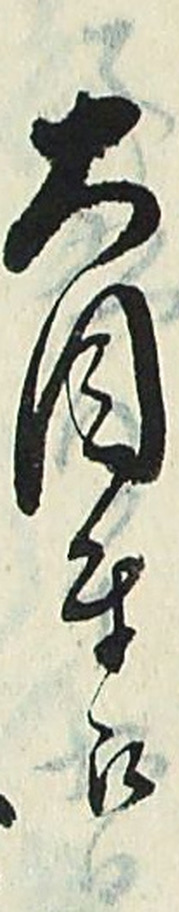大目付江
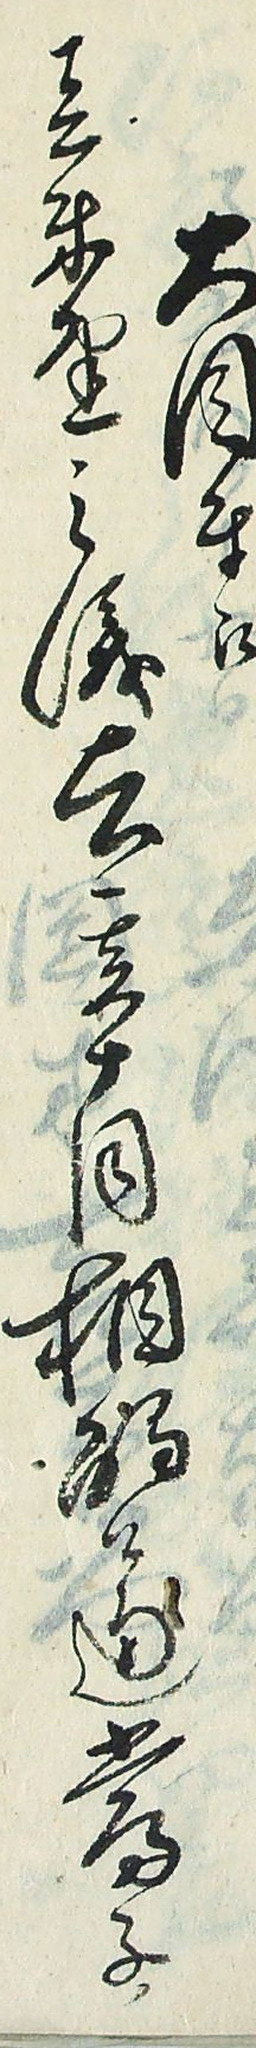壱朱金之儀去亥十月相触候通当子

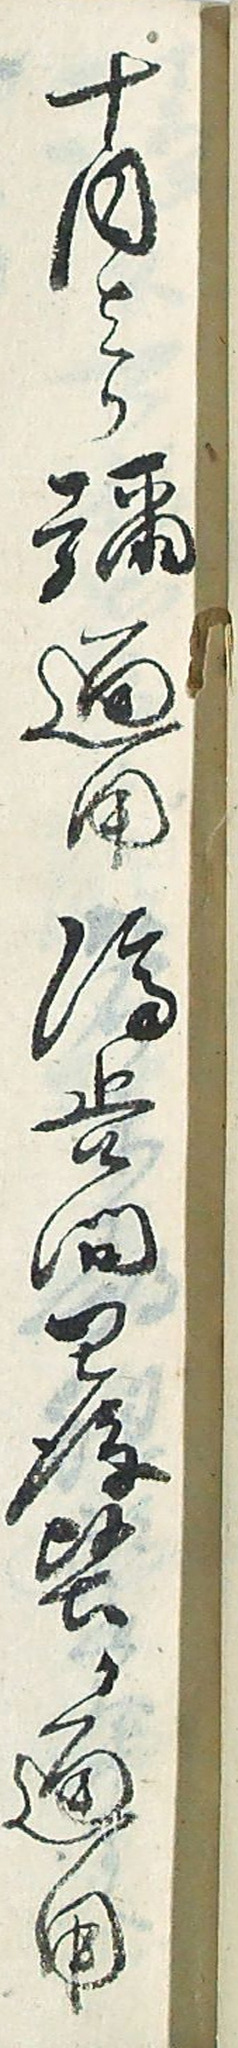十月より弥通用停止候間已後堅く通用
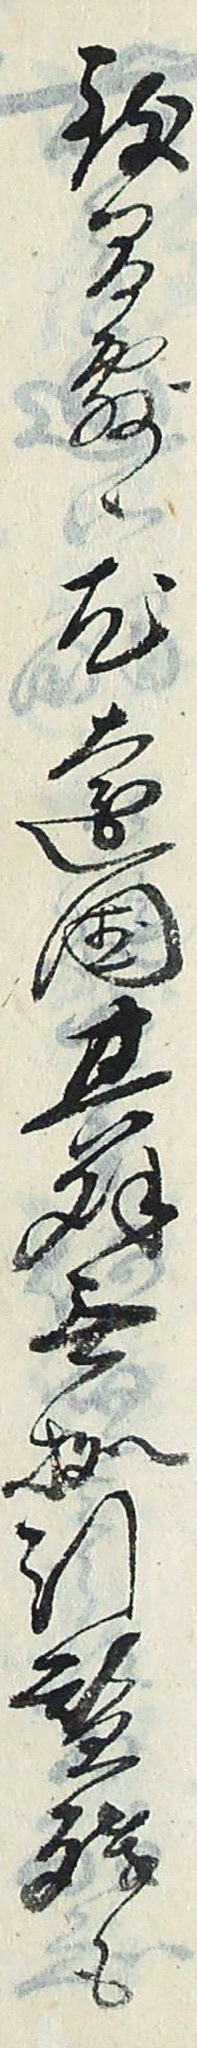致間敷候尤遠国其外無拠引替残も
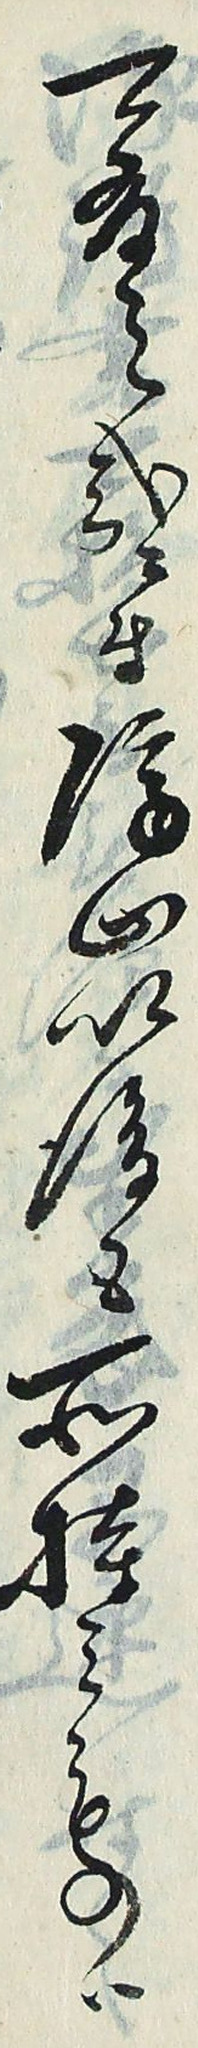可有之哉に付停止以後も所持のものは
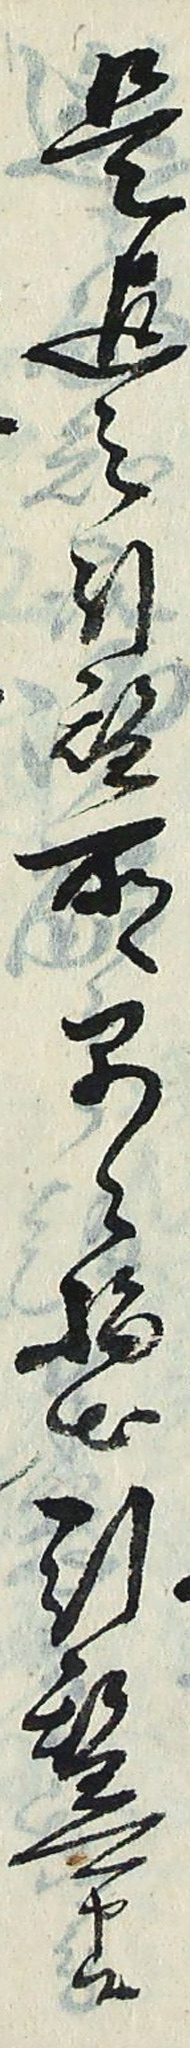是迄之引替所々早々指出引替可申候
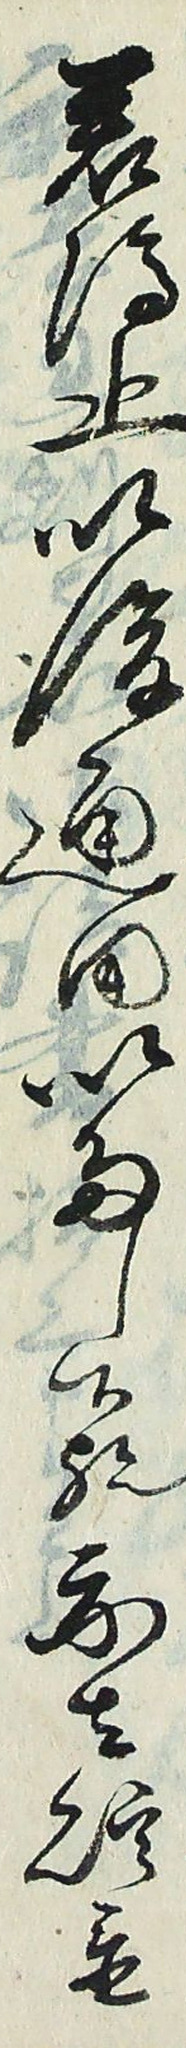若停止以後通用いたし候歟亦は貯置
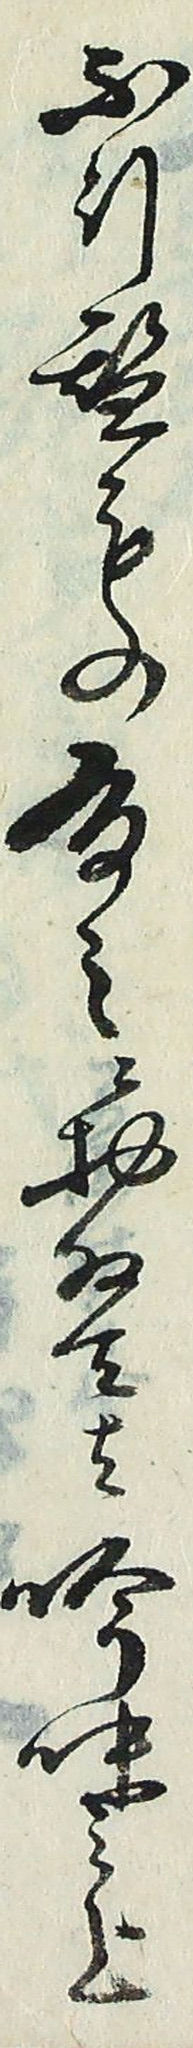不引替もの有之におゐては吟味之上
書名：諸御用御□受書控
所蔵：鳴門教育大学 Naruto University of Education
